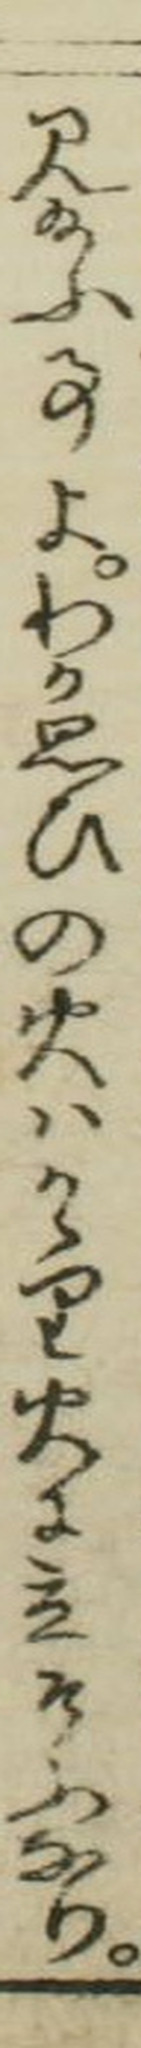見給ふ事よ。わか思ひの火はかゝり火に立そふなり。
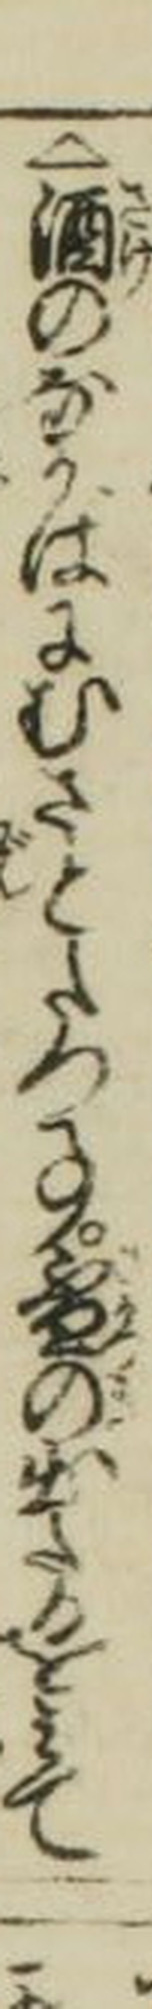△酒のなかばにむさとたつ事。盃の出たるをみて
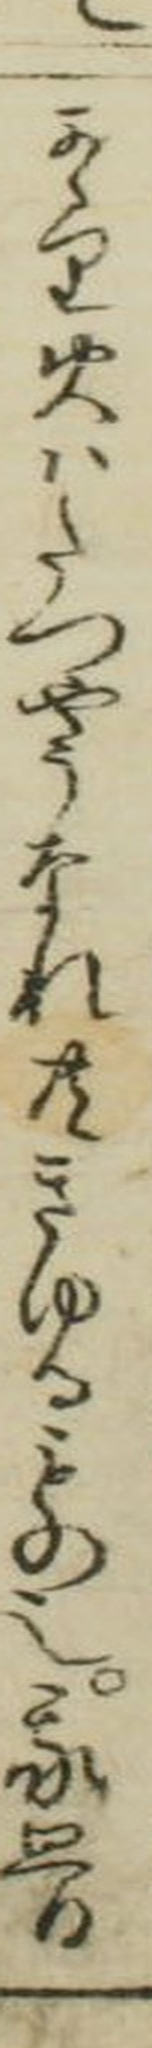かゝり火はたつやうなれ共きゆるもの也。我思ひ
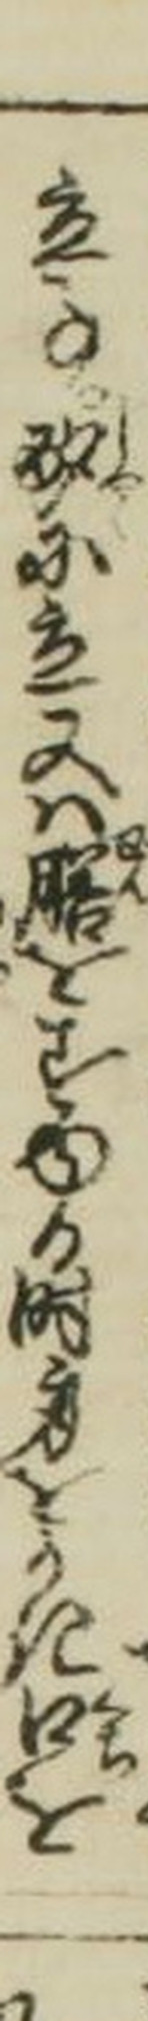立事。酌に立又は膳をすゆる時身をかき口を
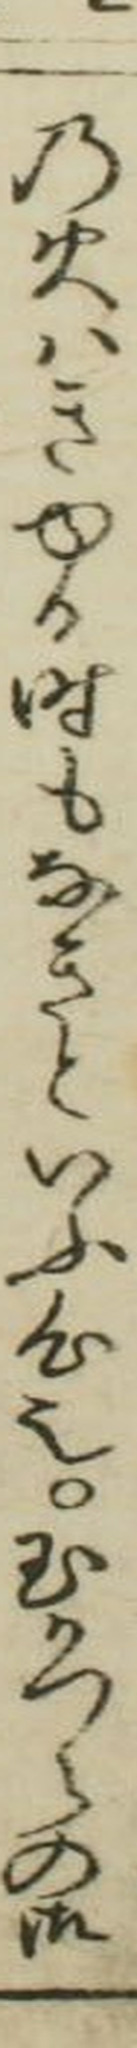の火はきゆる時もなきといふ心也。玉かつらの御
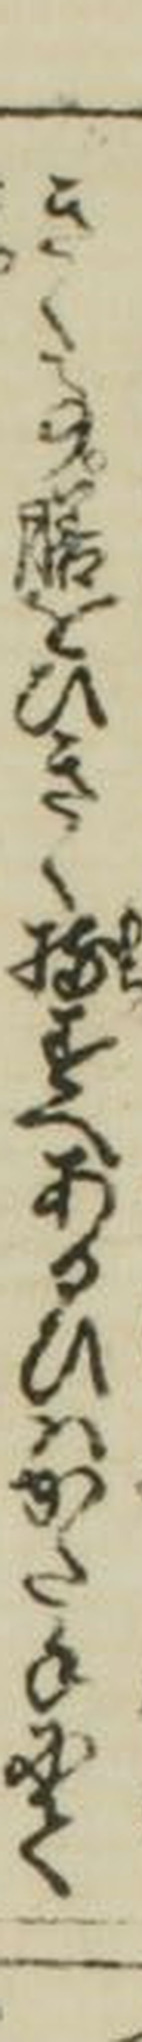きく事。膳をひきく持すへあるひはかた手にて
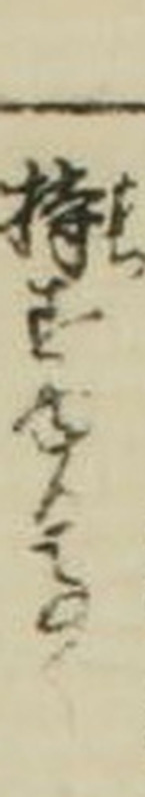持すゆる事
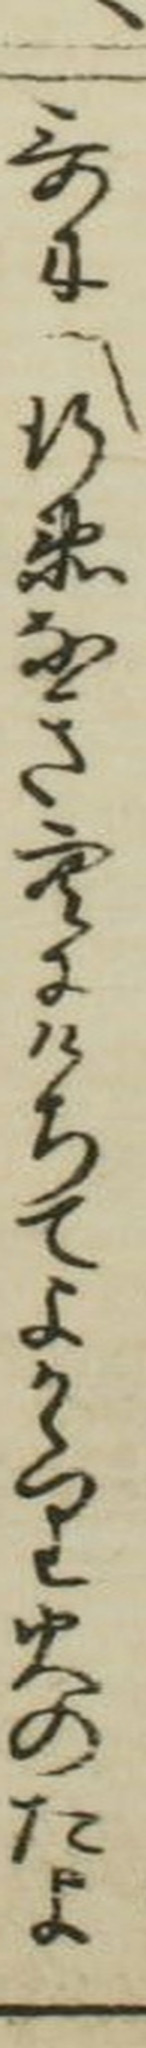哥に〽行ゑなき空にけちてよかゝり火のたよ
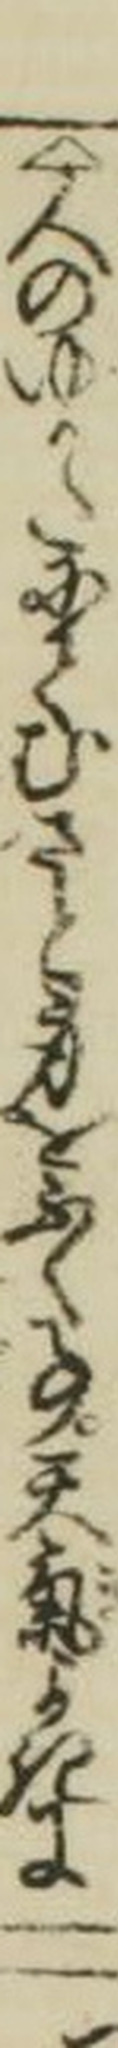△人のゆかたにてむさと身をふく事。天気よきに
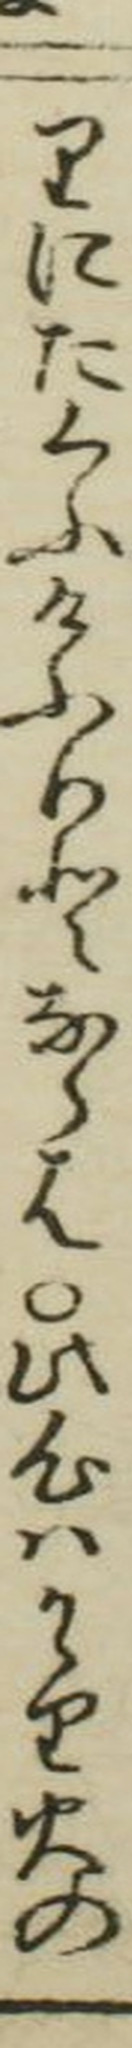りにたくふけふりとならは○此心はかゝり火の
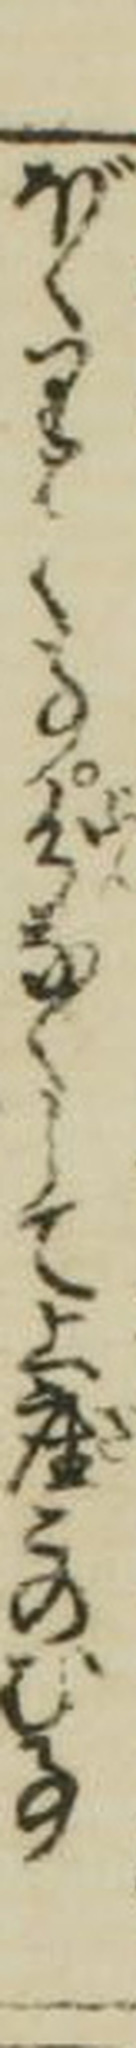ぼくりはく事。分なくして上座このむ事
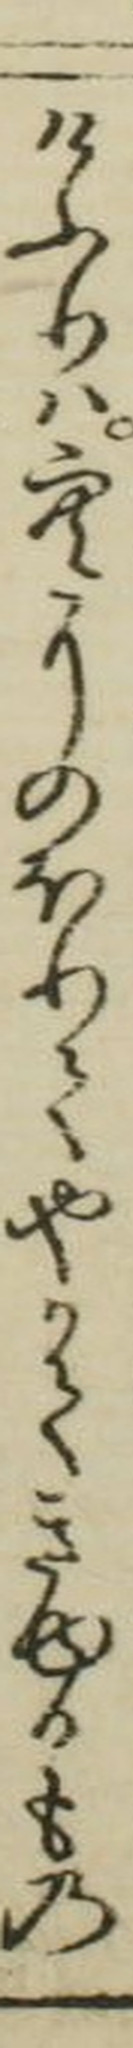けふりは。空にのほりてやかてきゆるもの
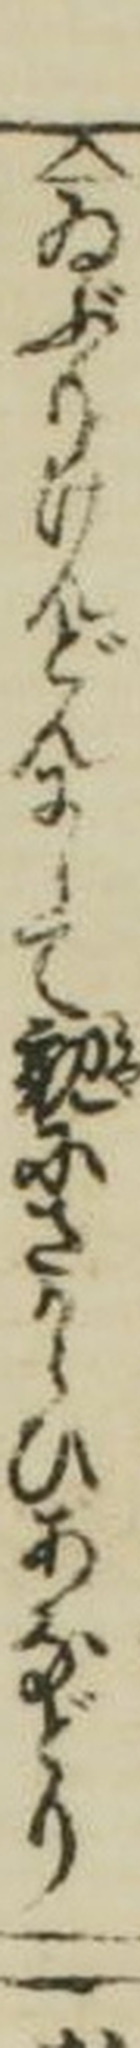△ゐぶりけんどんにして親にさからひあなどり
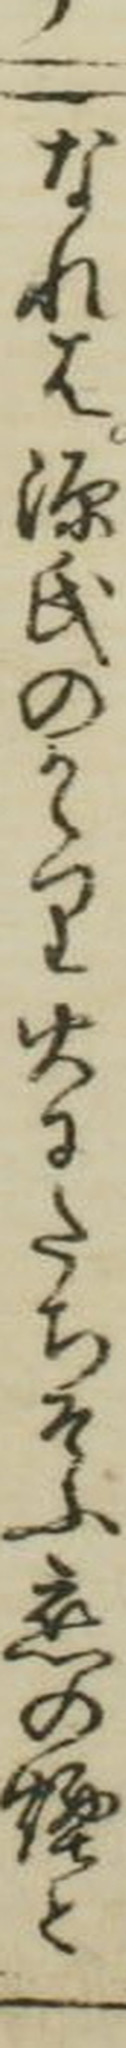なれは。源氏のかゝり火にたちそう恋の煙と
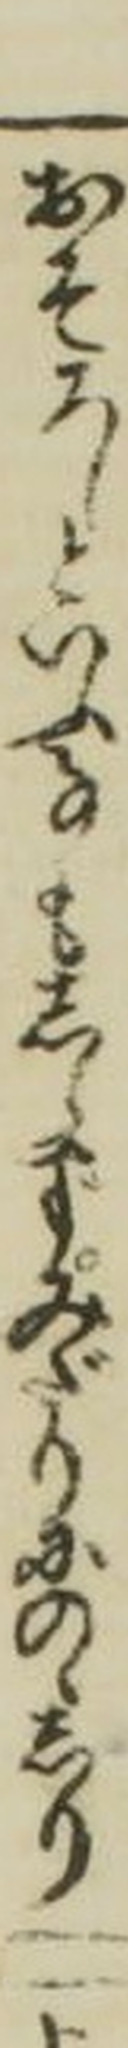おそろしといふ事もしらず。みだりにのゝしり
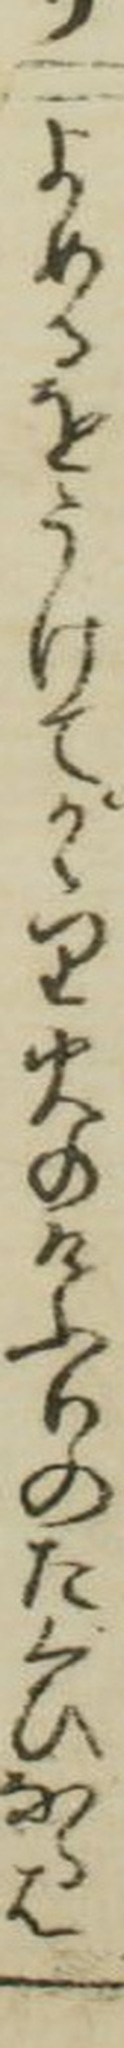よめるをうけて。かゝり火のけふりのたぐひならは
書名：女源氏教訓鑑
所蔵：東京学芸大学附属図書館
